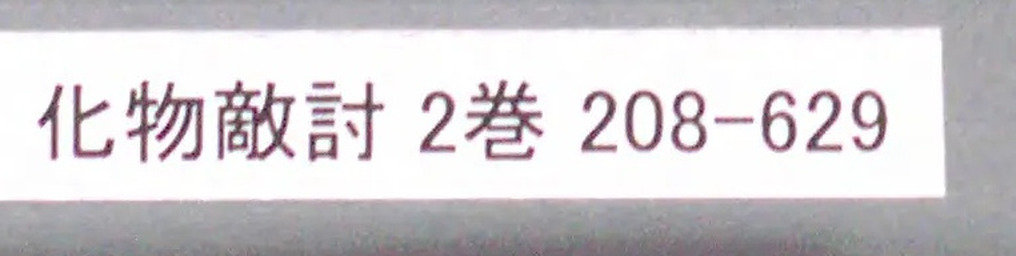化物敵討巻
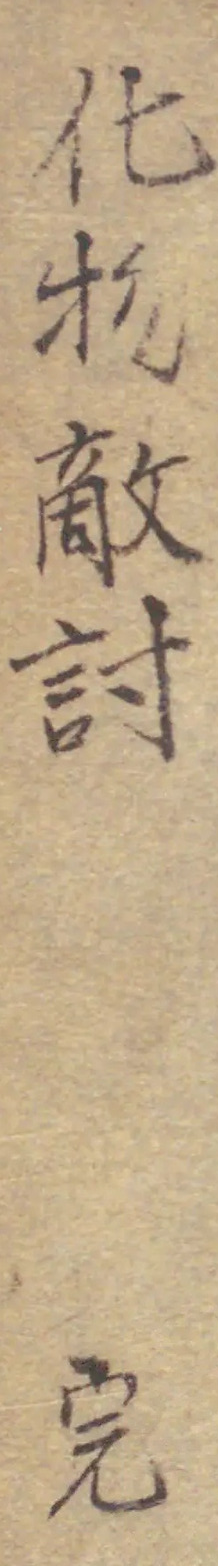化物敵討巻

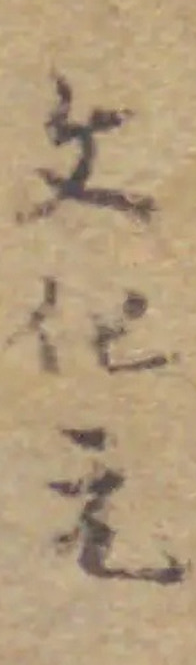文化元
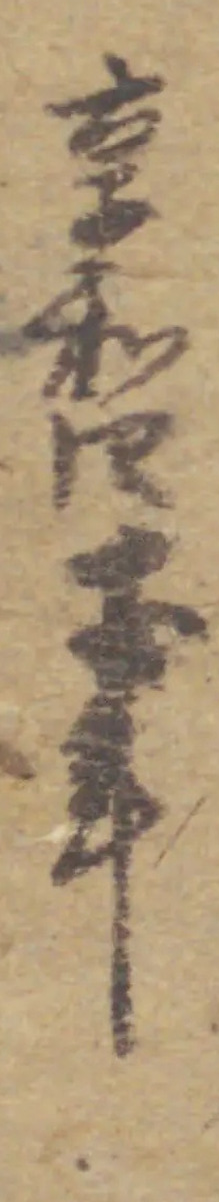享和四子年
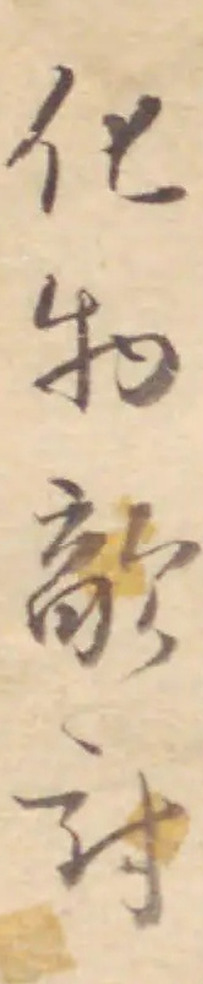化物敵討
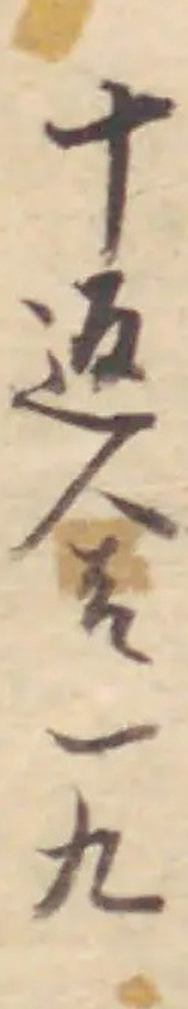十返舎一九
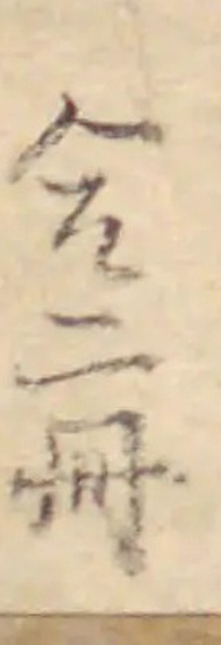合二冊

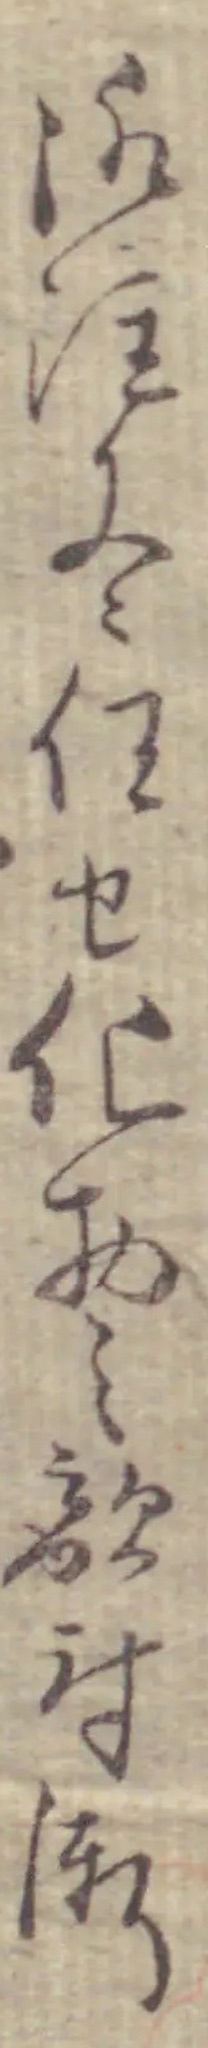御注文に任せ化物の敵討漸
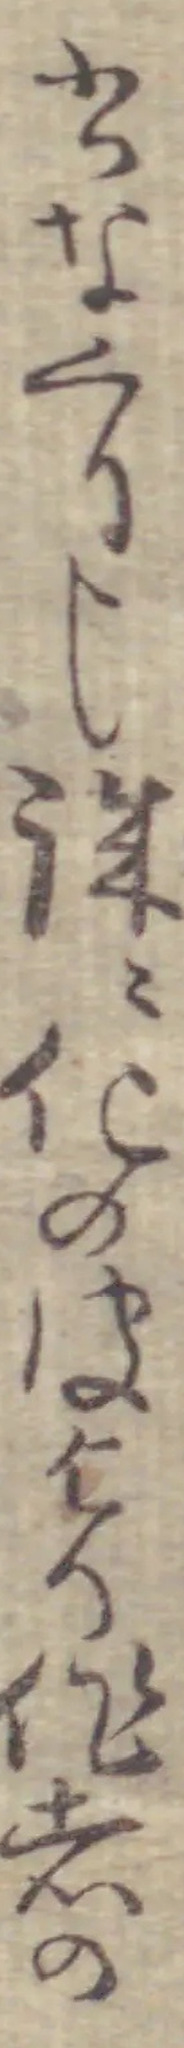書なくり申候誠に化の皮より作者の
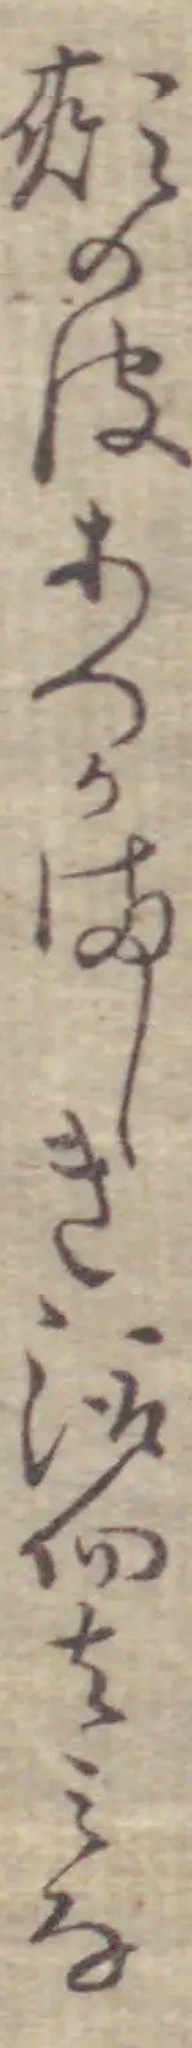頬の皮あつかましき趣向はみな
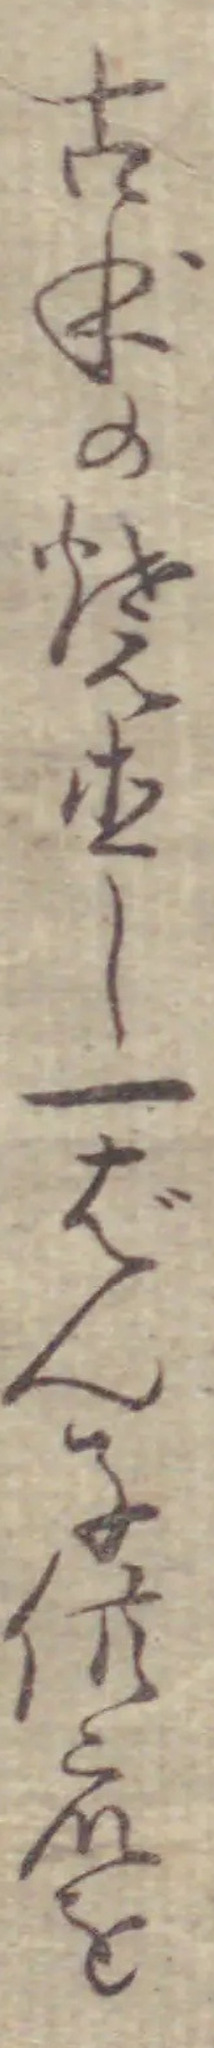古本の焼直し一ばん子供衆を
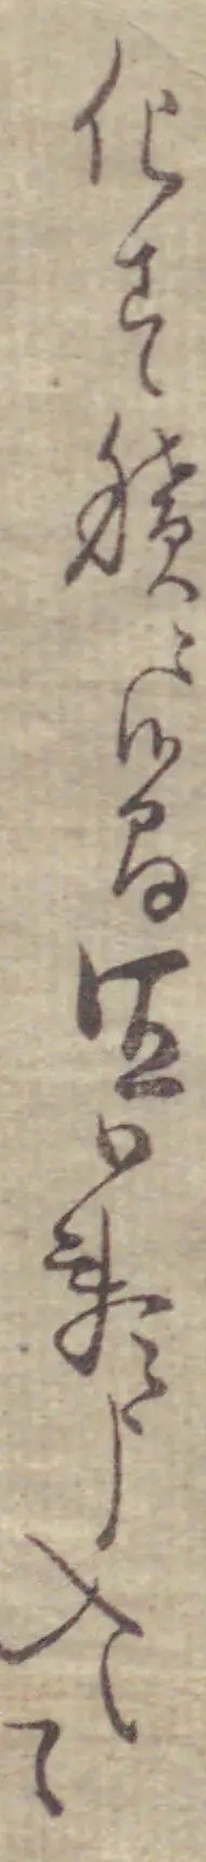化す積に候間宜御頼申入候以上

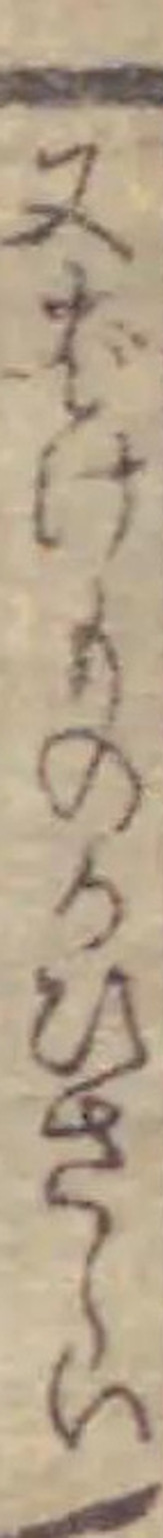又ばけものかひさしい
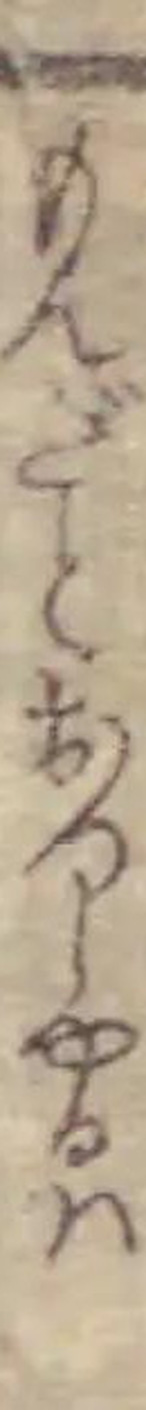もんだとおつしやるは
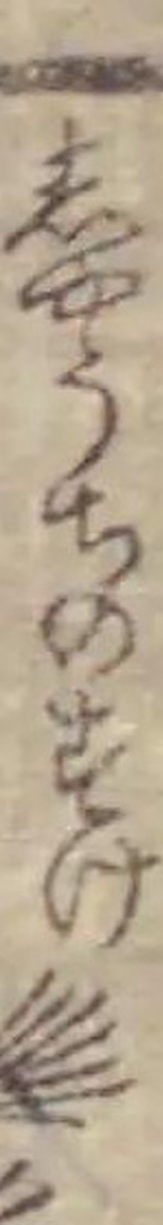しやうちのすけ
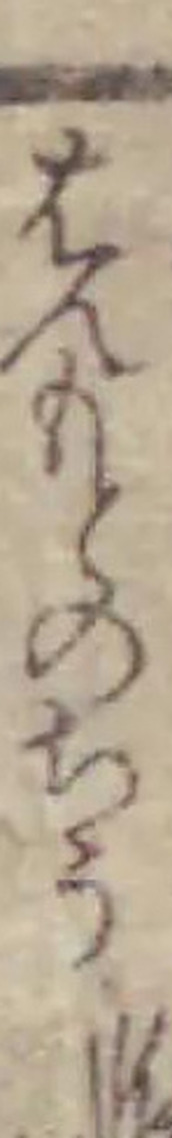はんもとのちう
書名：化物敵討 2巻
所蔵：国立国会図書館 National Diet Library, JAPAN
